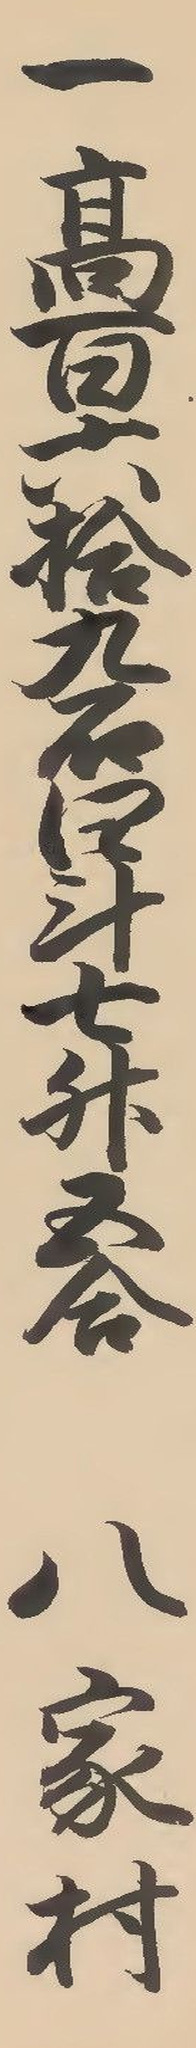一髙百六拾九石四斗七升五合八家村
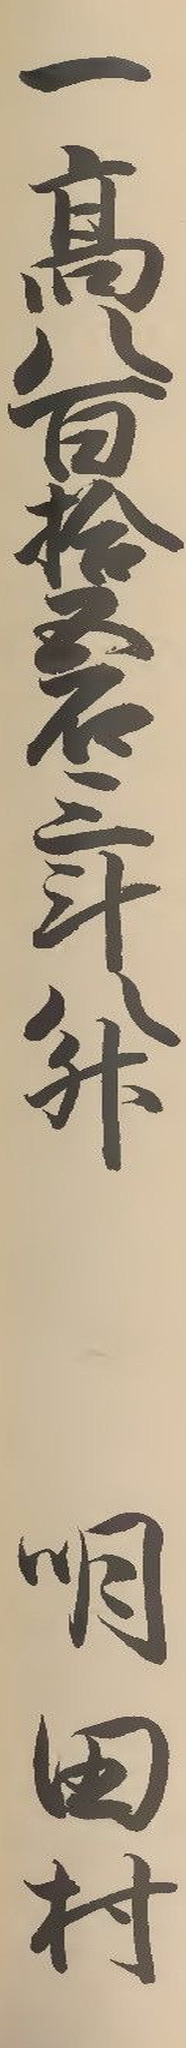一髙八百拾五石三斗八升明田村
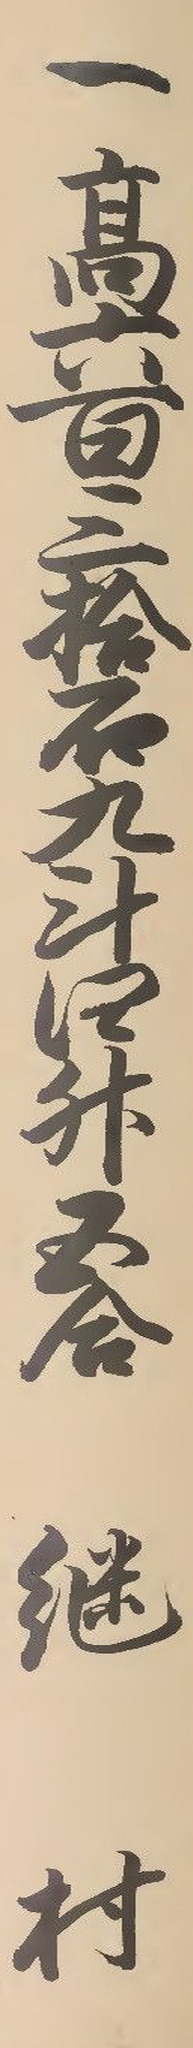一髙六百三拾石九斗四升五合継村
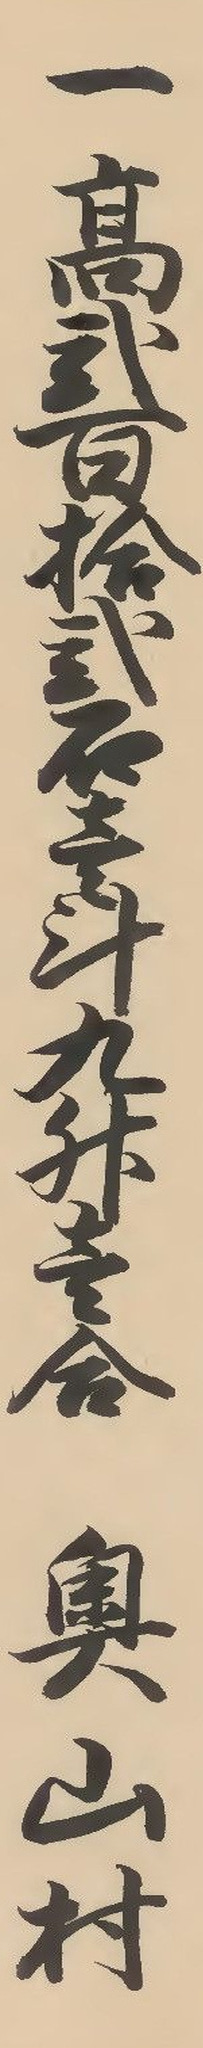一髙弐百拾弐石壱斗九升壱合奥山村
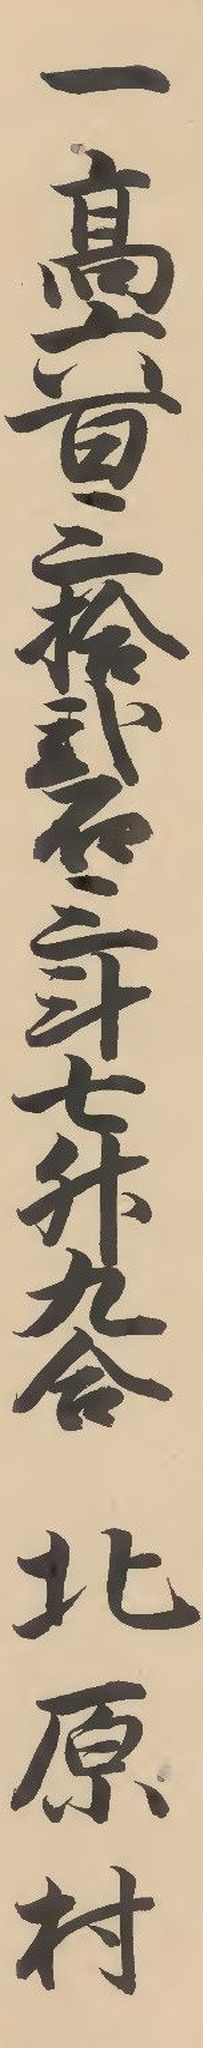一髙六百三拾弐石三斗七升九合北原村
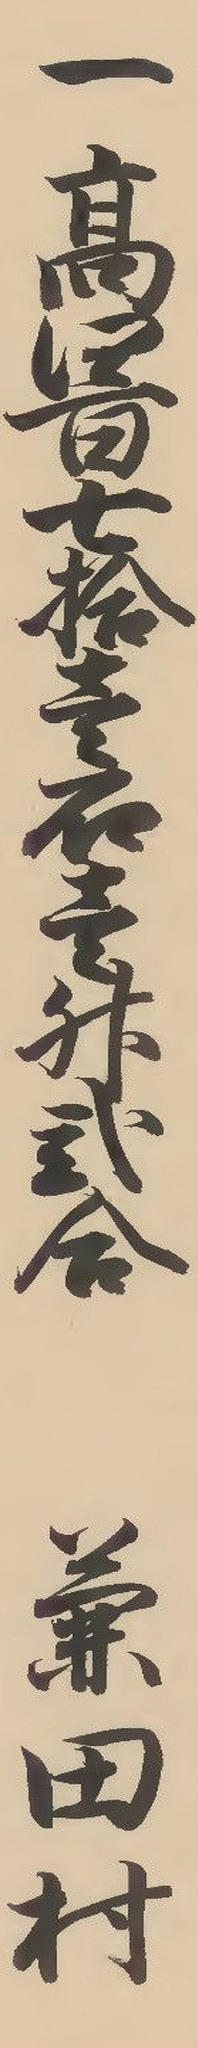一髙四百七拾壱石壱升弐合兼田村

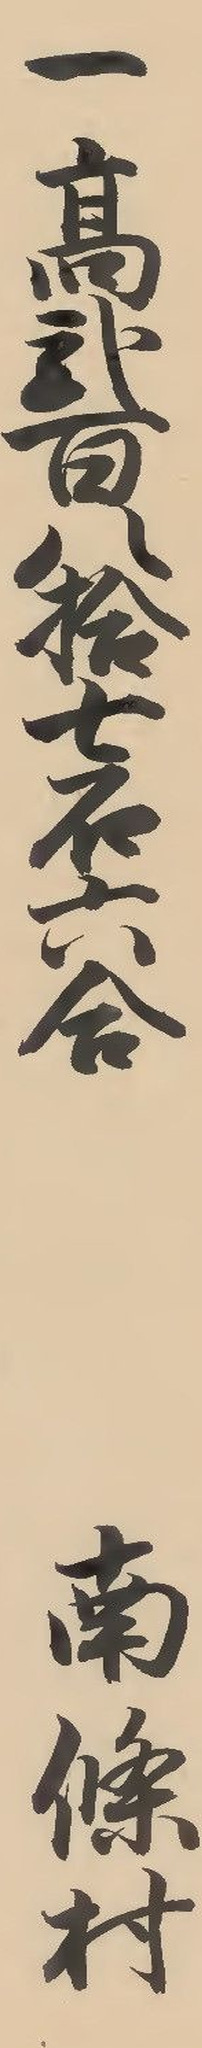一髙弐百八拾七石六合南條村
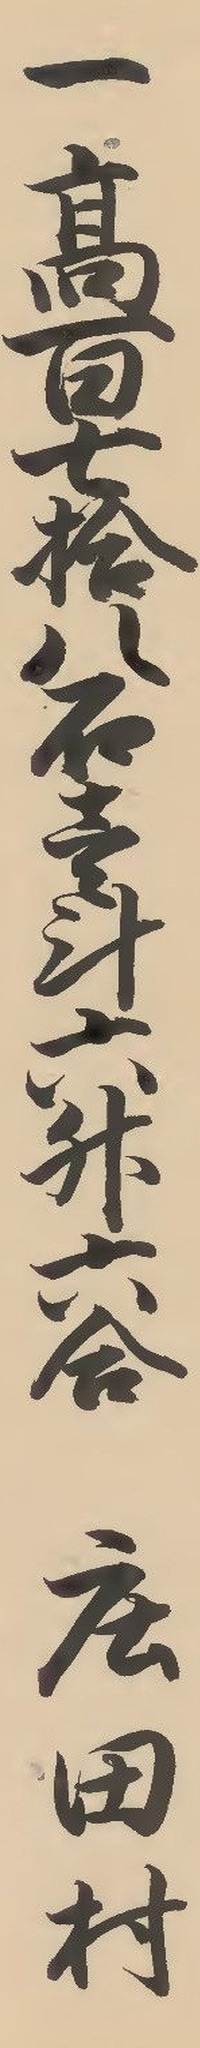一髙百七拾八石壱斗六升六合庄田村
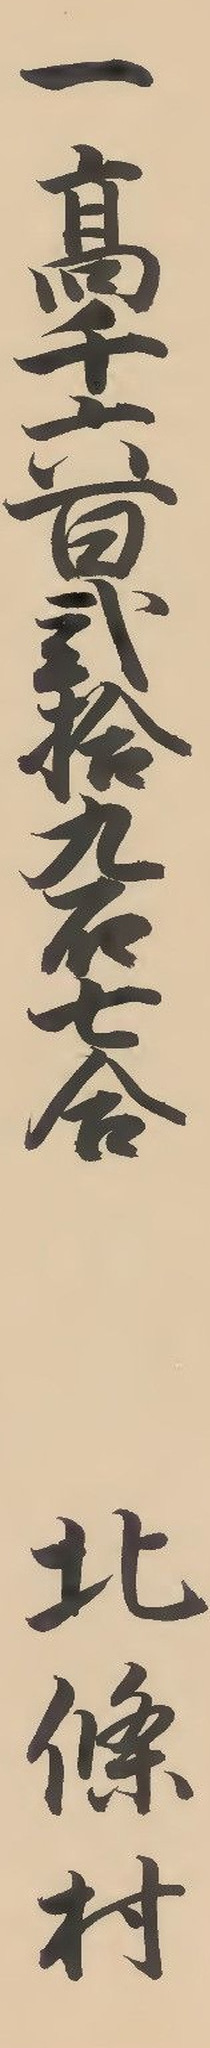一髙千六百弐拾九石七合北條村
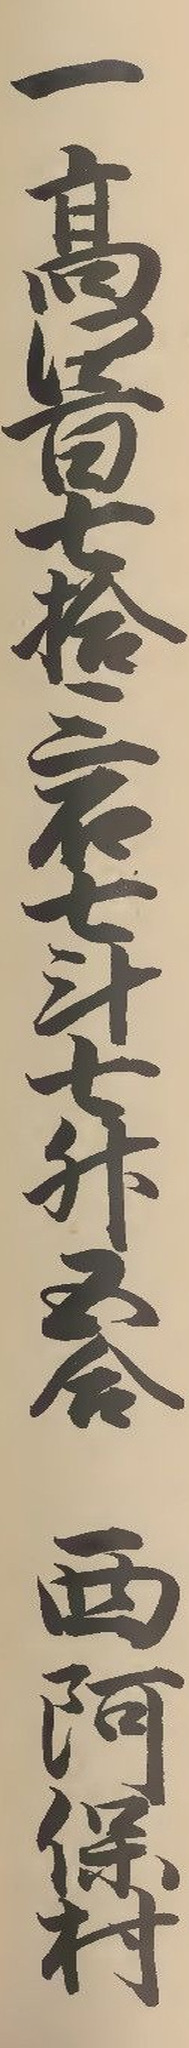一髙四百七拾三石七斗七升五合西阿保村
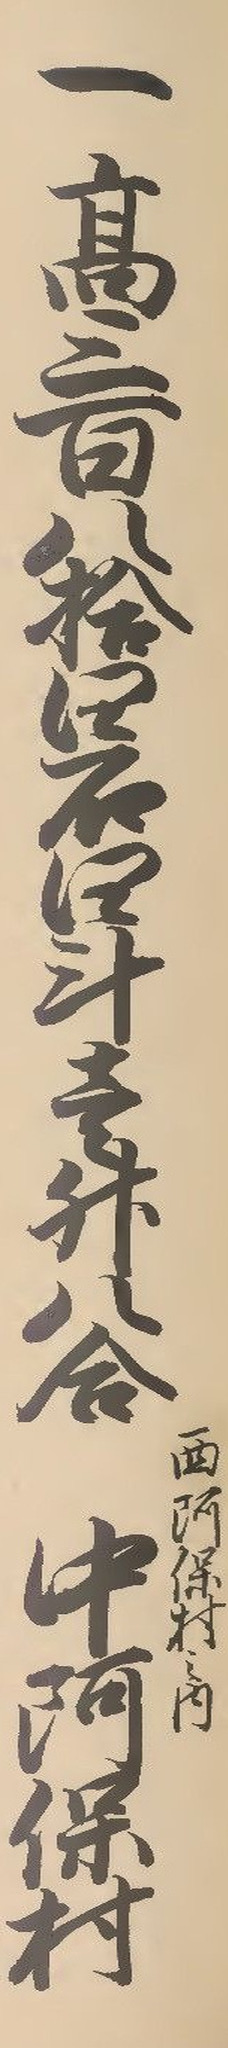一髙三百八拾四石四斗壱升八合中阿保村
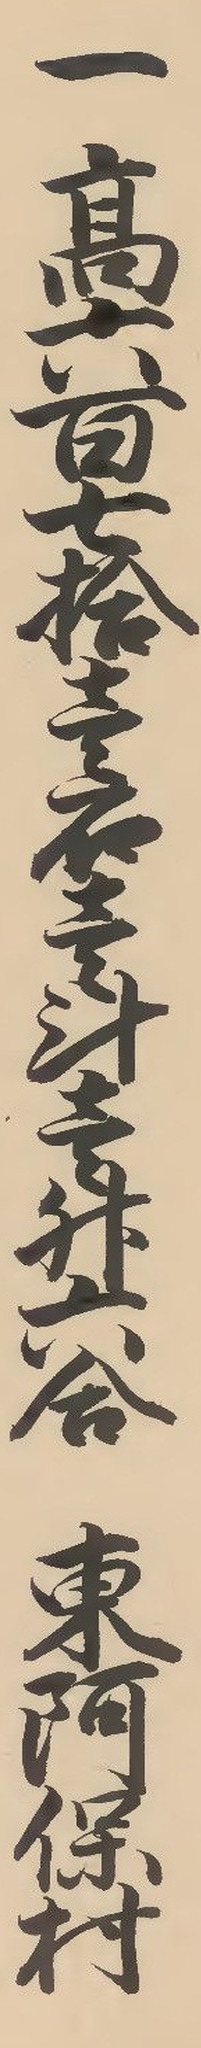一髙六百七拾壱石壱斗壱升六合東阿保村
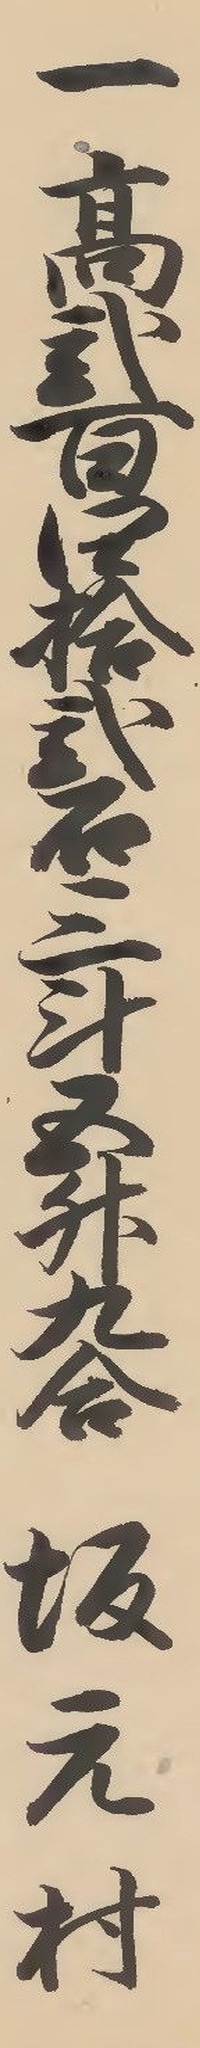一髙弐百四拾弐石三斗五升九合坂元村
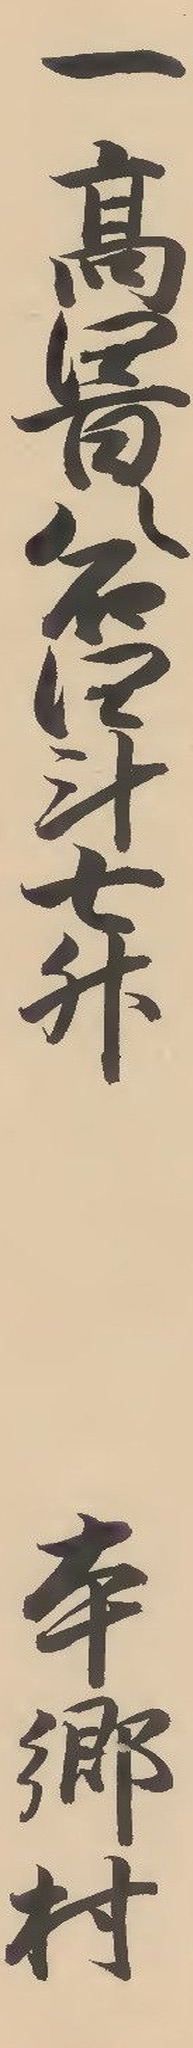一髙四百八石四斗七升本郷村

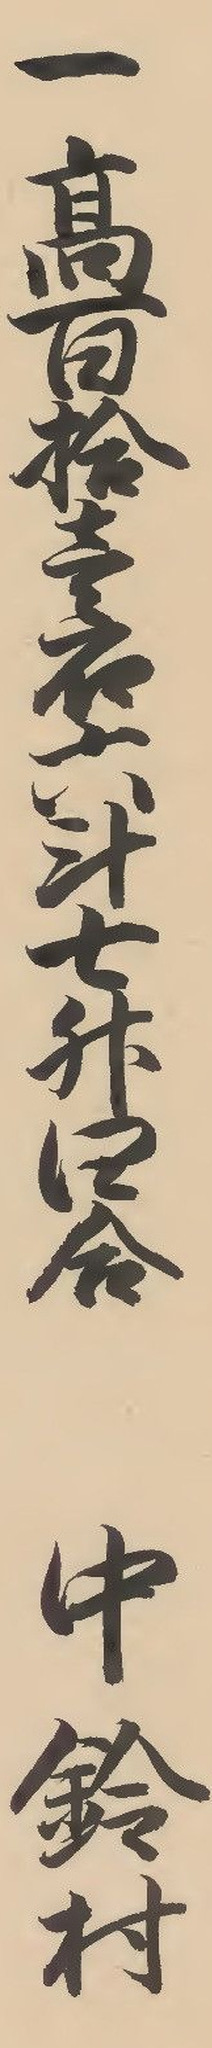一髙百拾壱石六斗七升四合中鈴村
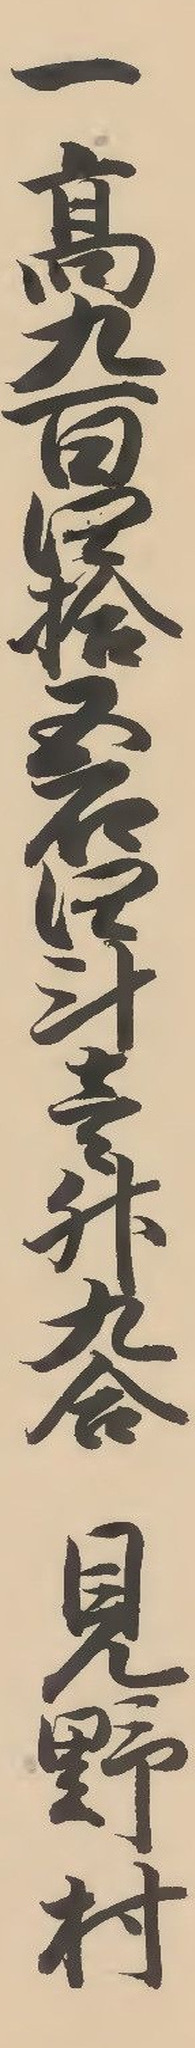一髙九百四拾五石四斗壱升九合見野村
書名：播磨国郷帳
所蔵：国立公文書館 National Archives of Japan
